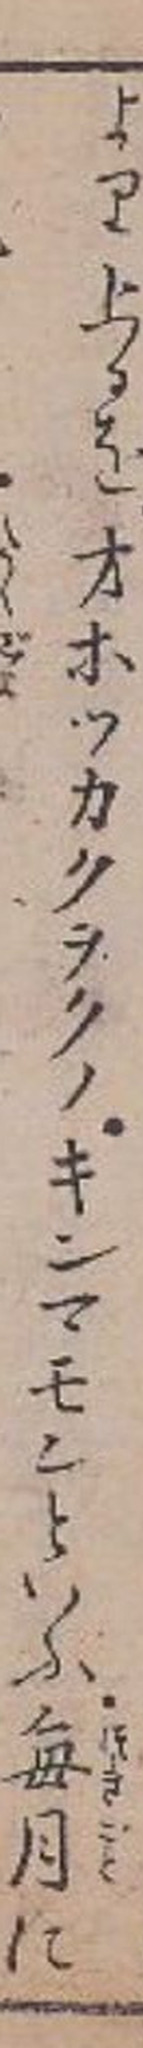より上るを、オホツカクヲクノ、キンマモンといふ、毎月に
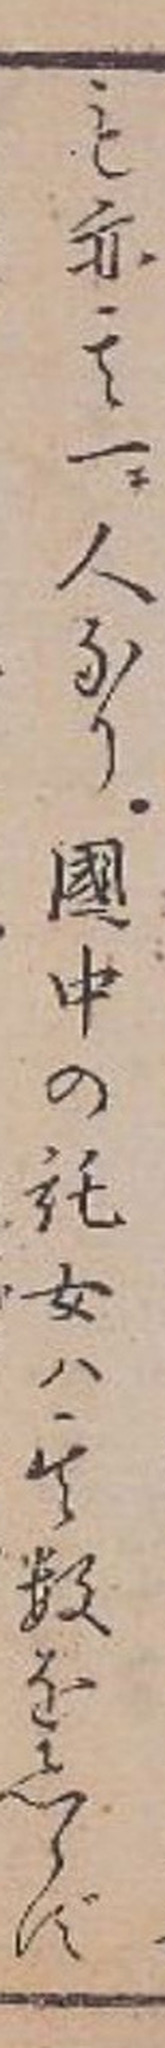も亦其一人なり、国中の託女は其数を知らず
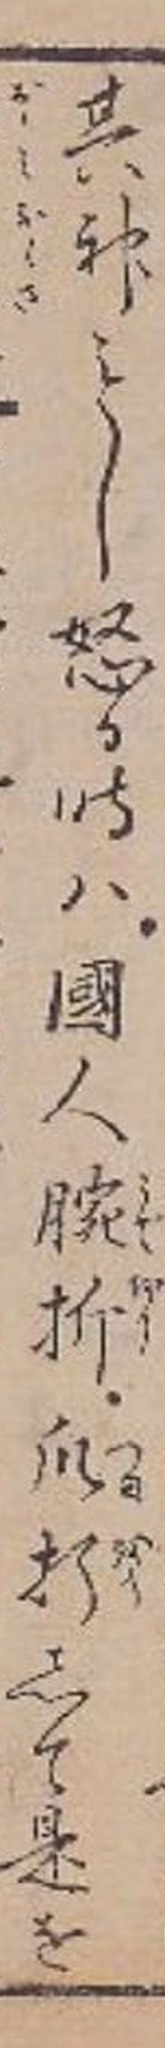其神み〳〵怒る時は、国人腕折、爪折して是を
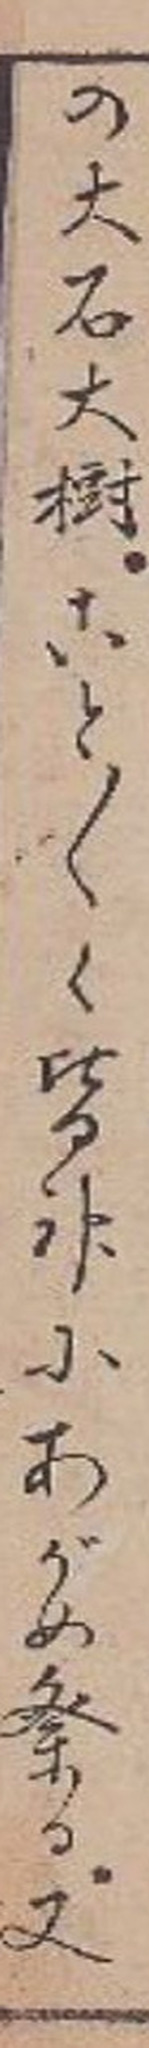の大石大樹、こと〳〵く皆神にあがめ祭る、又
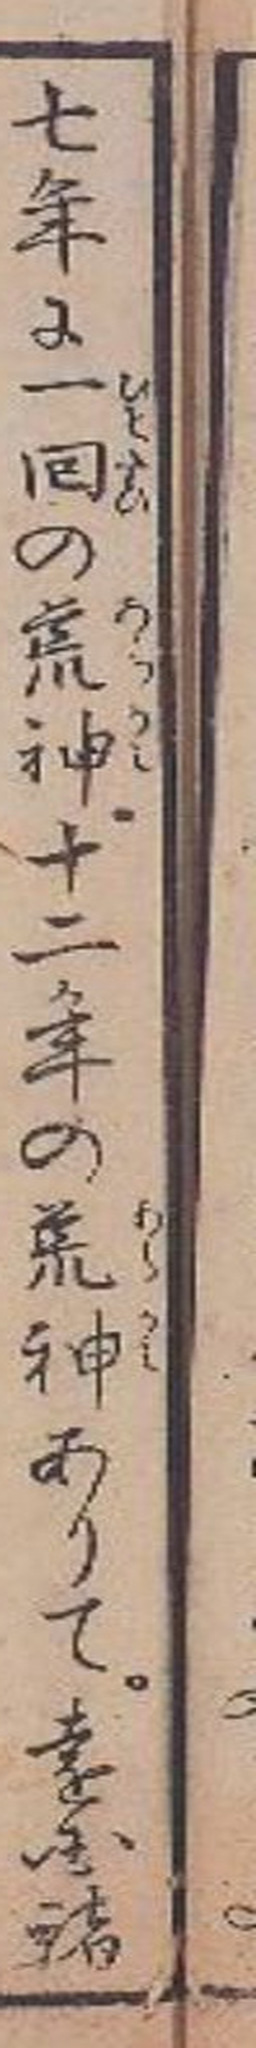七年に一回の荒神、十二年の荒神ありて、遠国諸
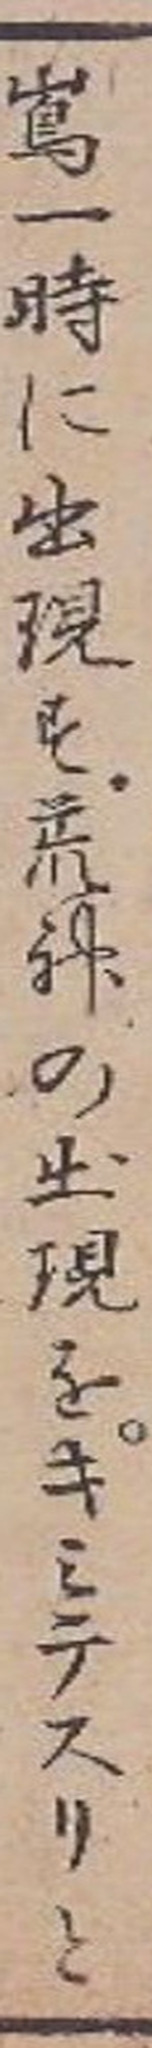島一時に出現す、荒神の出現を、キミテスリと
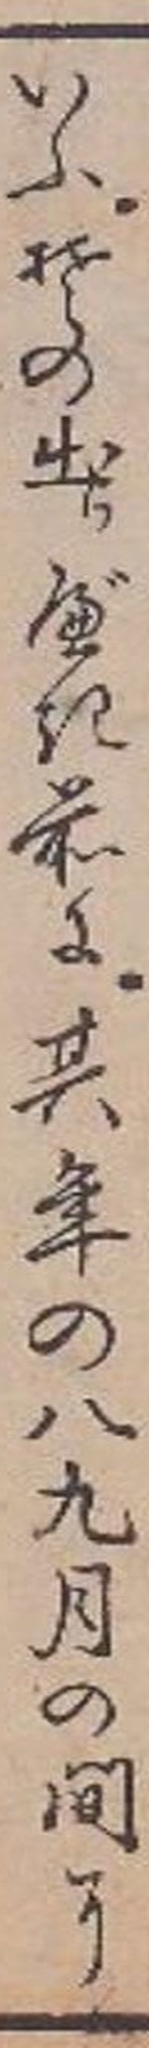いふ、その出べき前に、其年の八九月の間に
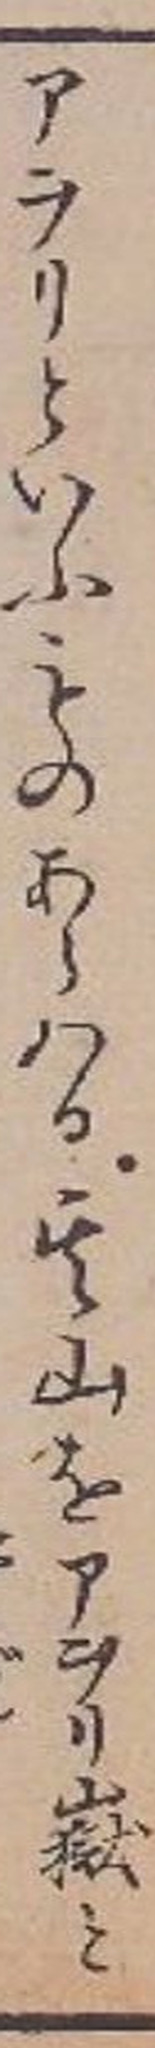アヲリといふものあらはる、其山をアヲリ嶽と
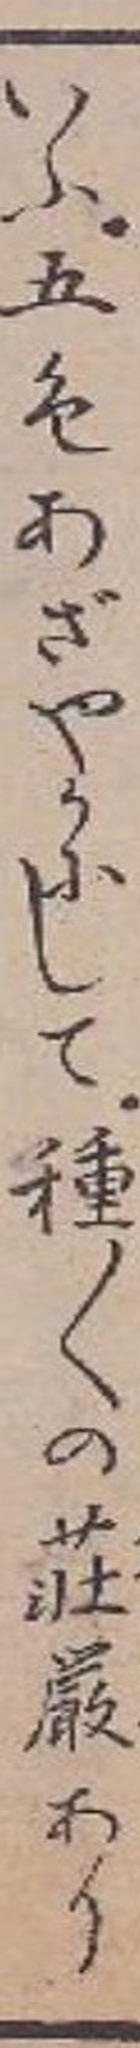いふ、五色あざやかにして、種〳〵の荘厳あり
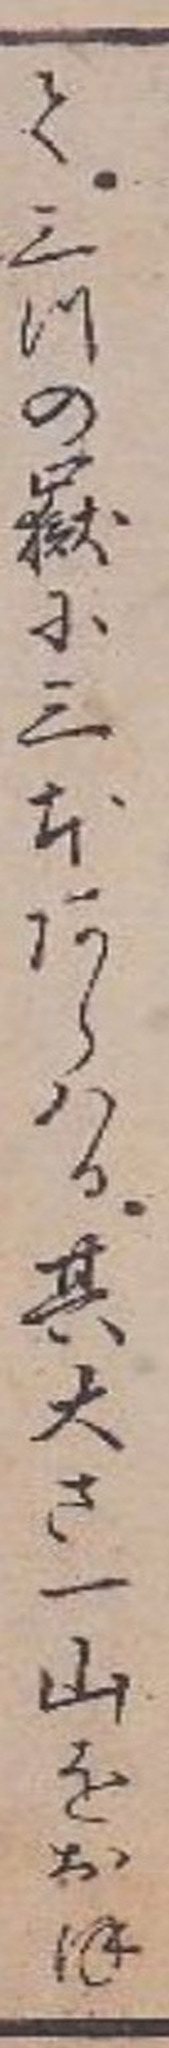て、三つの嶽に三本あらはる、其大さ一山をおほ
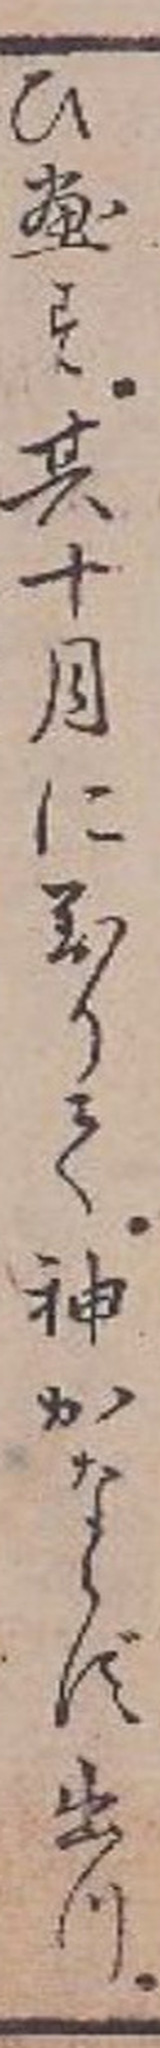ひ尽す、其十月に到りて、神かならず出つ、
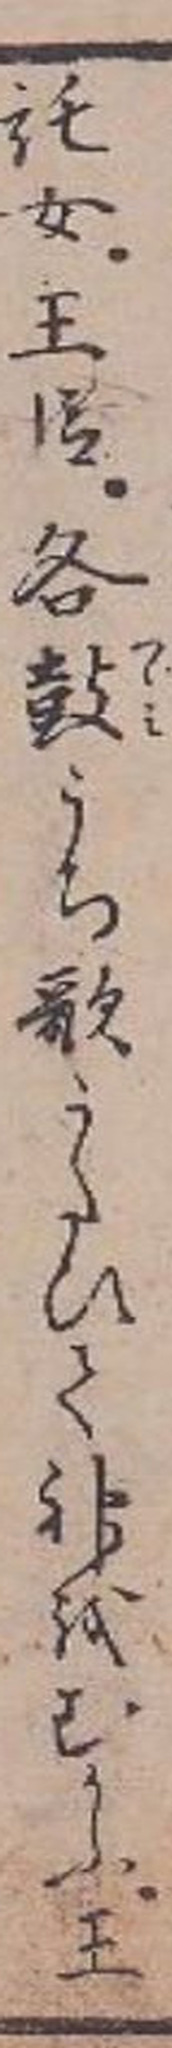託女、王臣、各鼓うち歌うたひて神をむかふ、王
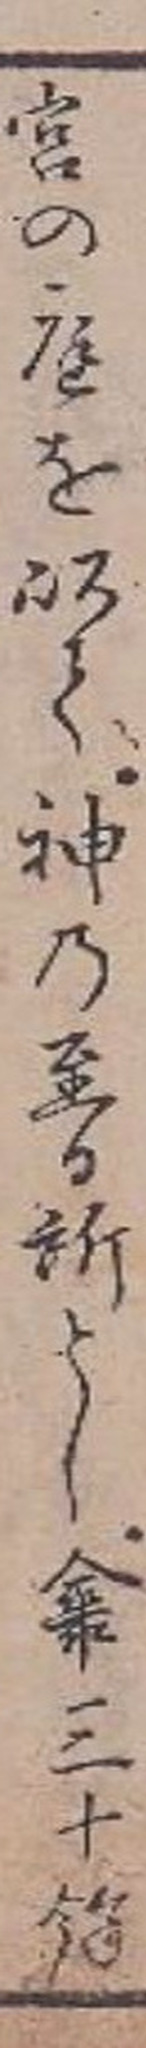宮の庭を以て、神の至る所とし、傘三十余
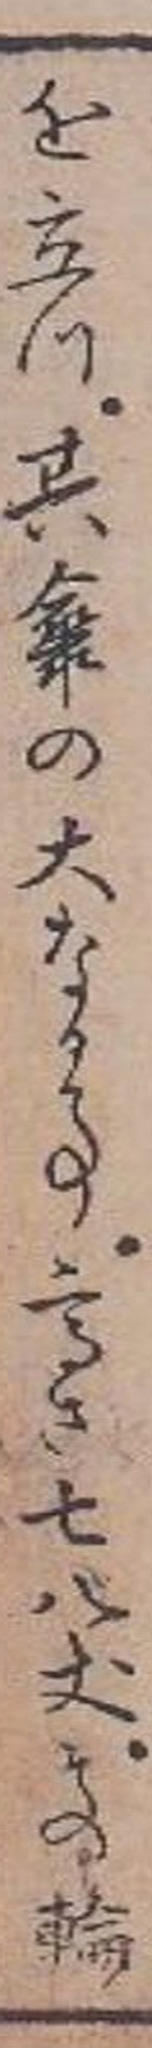を立つ、其傘の大なる事、高さ七八丈、その輪

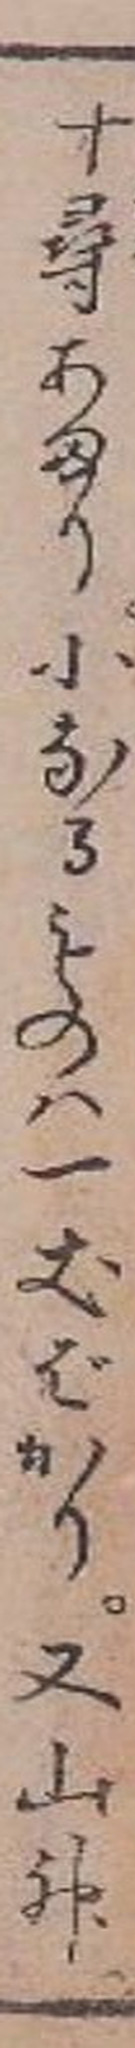十尋あまり、小なるものは一丈ばかり、又山神
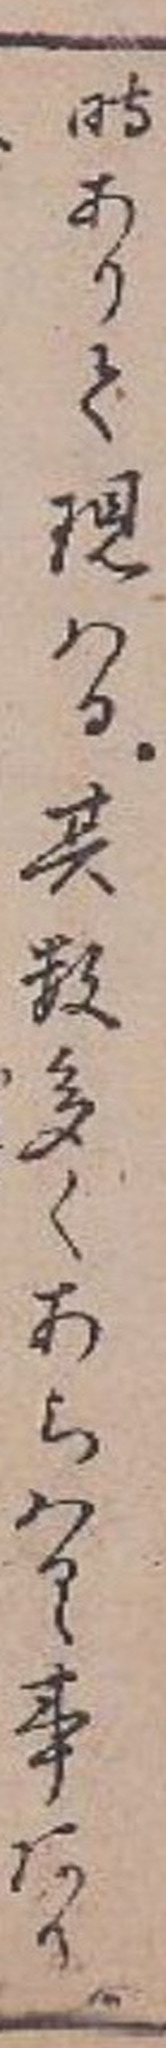時ありて現はる、其数多くあらはるゝ事あり、
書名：琉球談
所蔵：University of the Ryukyus Library
